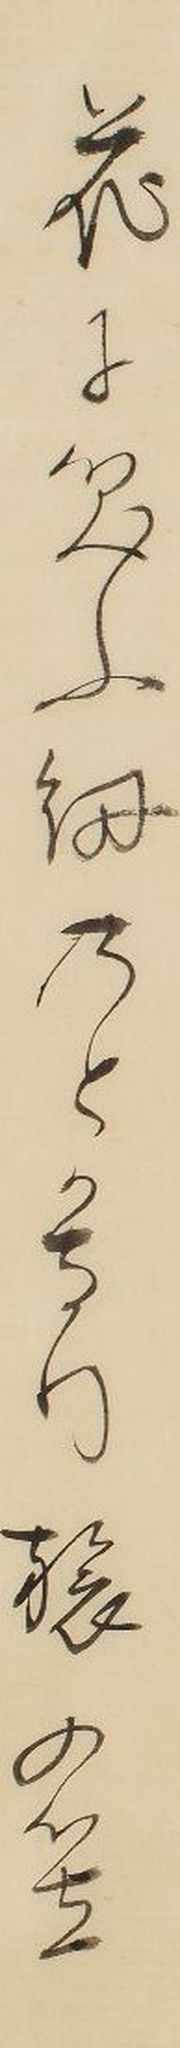花に負ふ紐のとかなり旅の笠
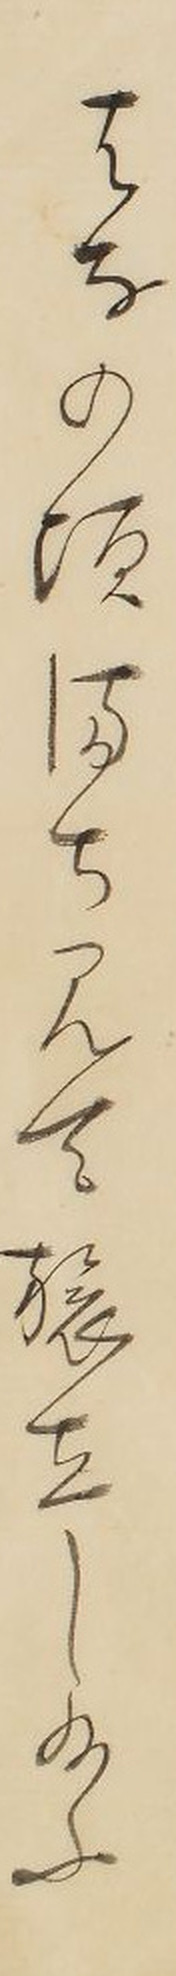はなの頃まち見て旅立し給ふ
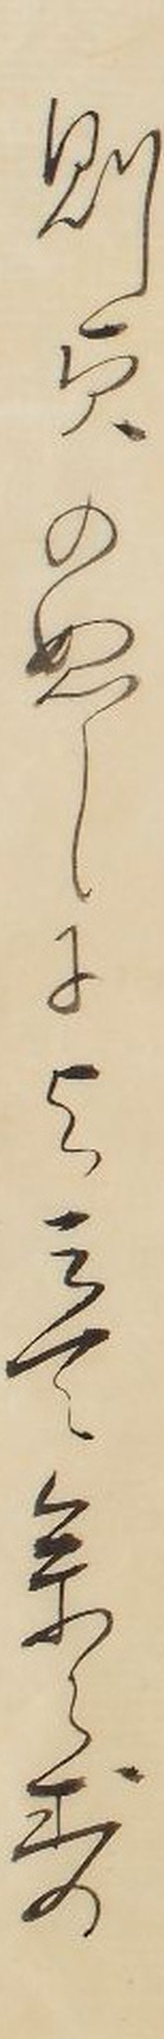則貞のぬしによみて参らす
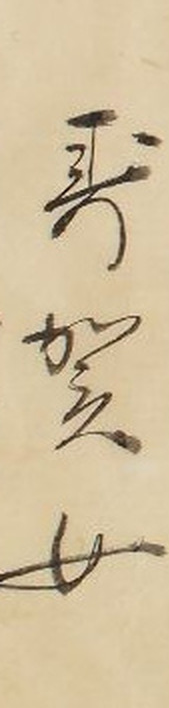寿賀女
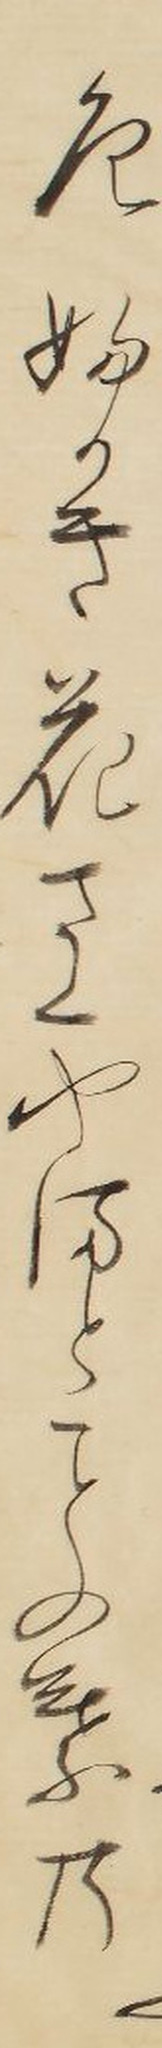色ふかき花さくやまとことの葉の
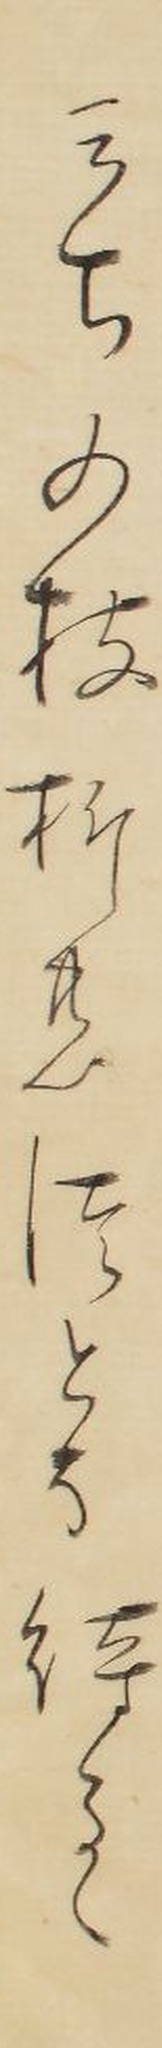みちの枝折のつとそ待るゝ

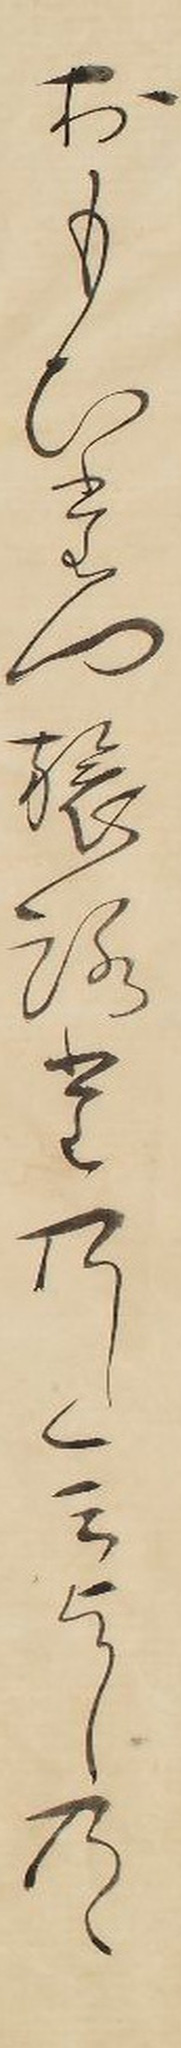おもひたつ旅路たのしくみよしのゝ
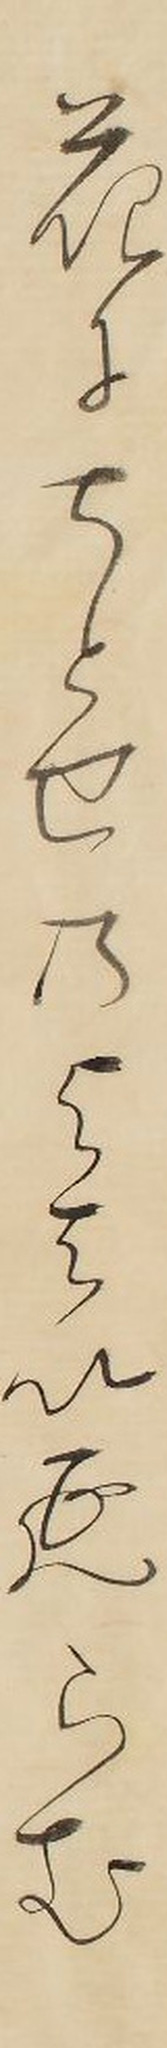花にちとせのよはい延らむ
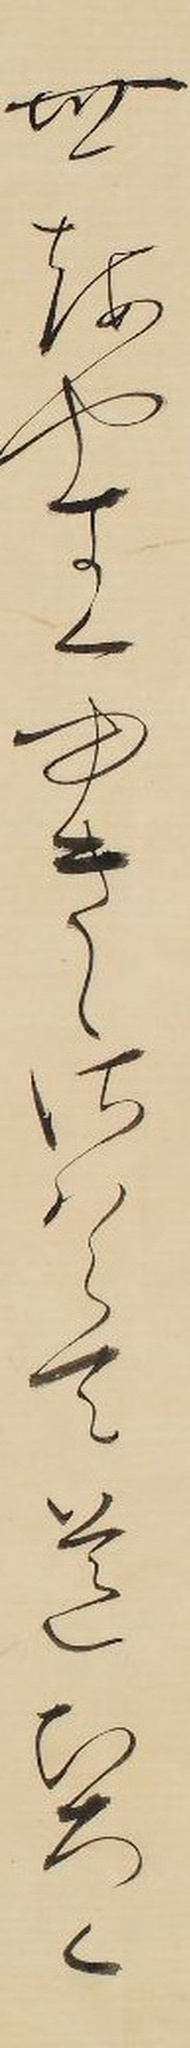世をやすくゆきゝさはらて道ひろく
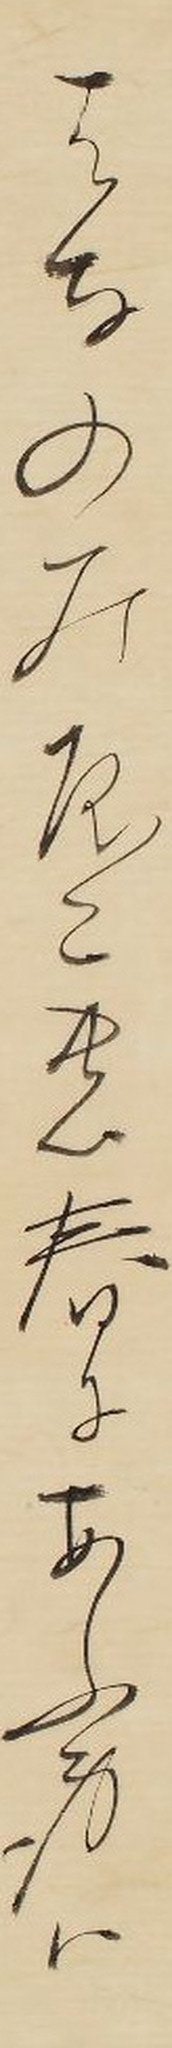はなのみやこの春にあふ身は
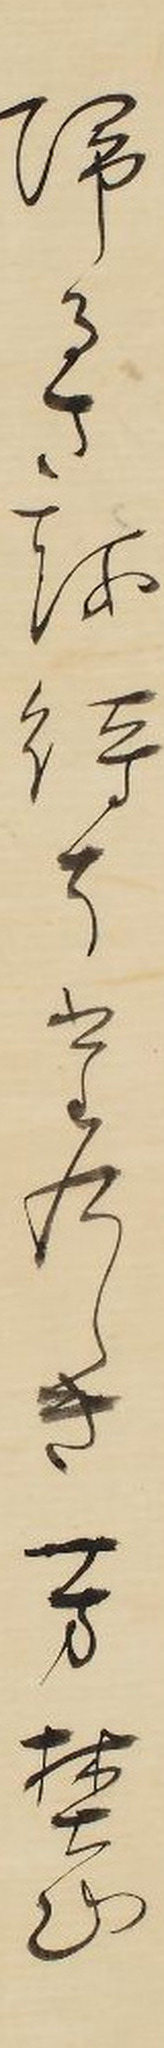帰るさを待そたのしき芳野山
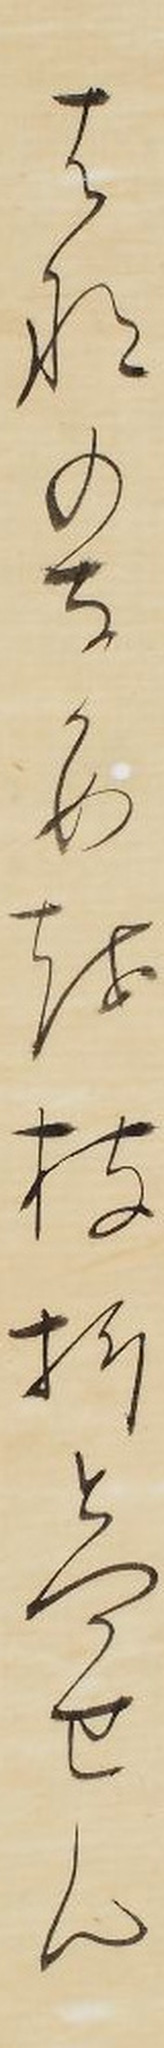はなのなかめを枝折とやせん
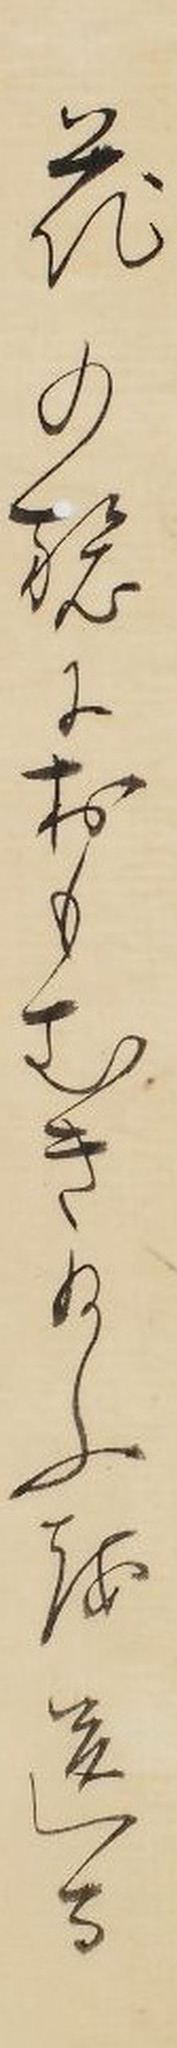花の旅におもむき給ふを送る
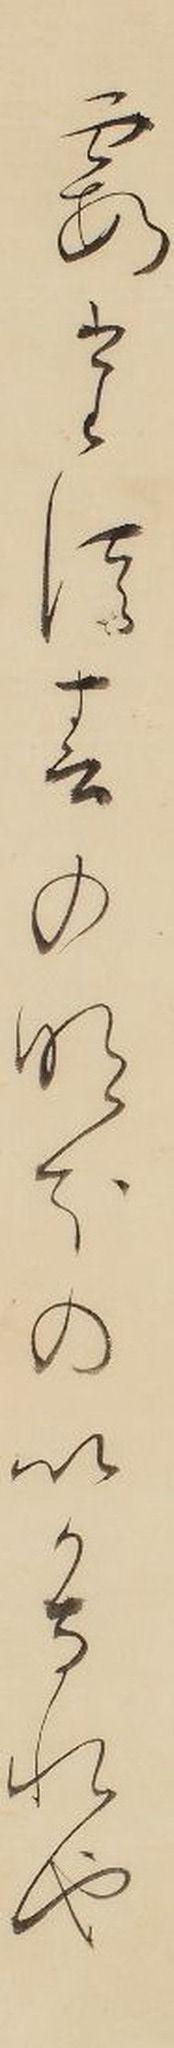霞たつ春の明ほのいかなれや
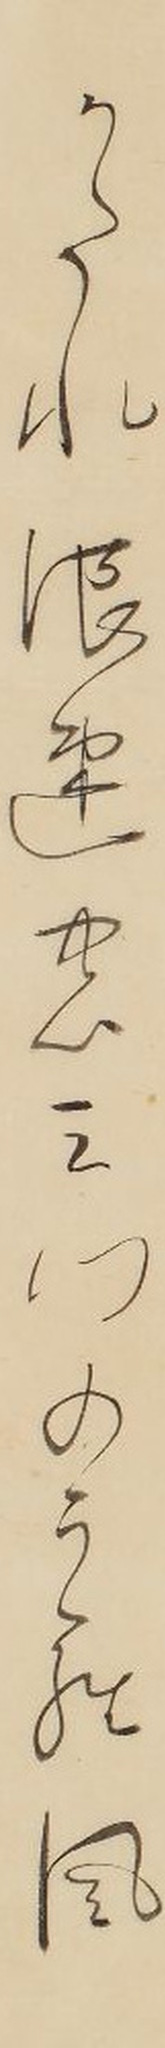かたれ浪速のみつのうら風
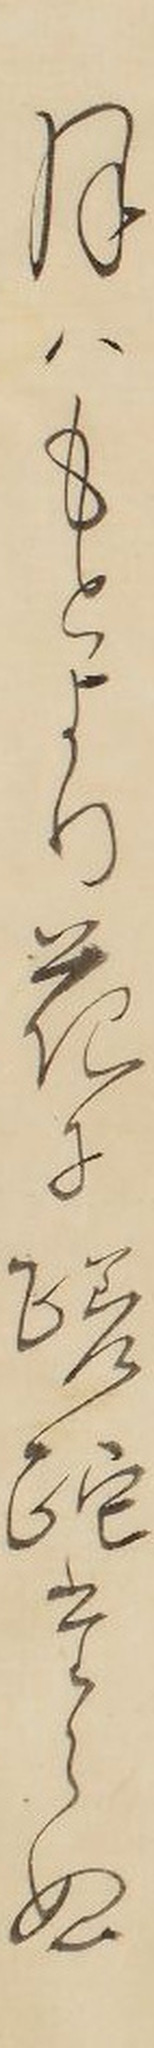月はもとより花に蹉跎たらぬ
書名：花土産
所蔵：徳島県立図書館
